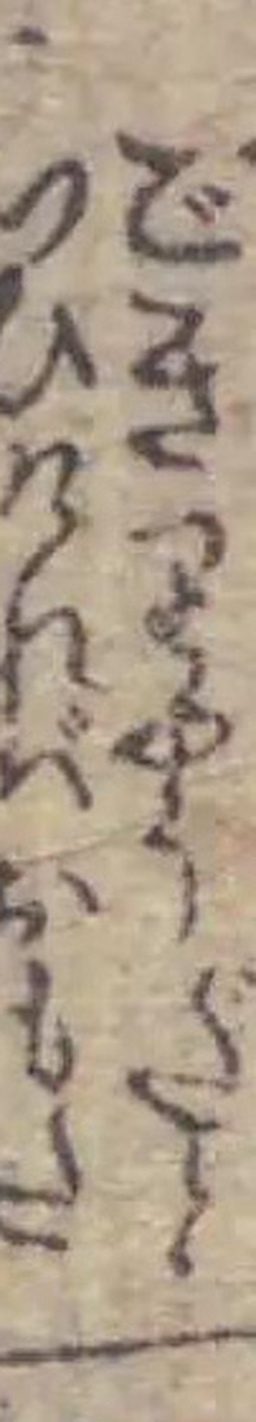いひければおもた
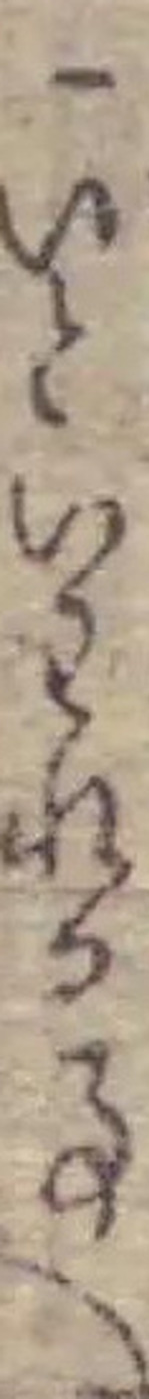いといわれる事
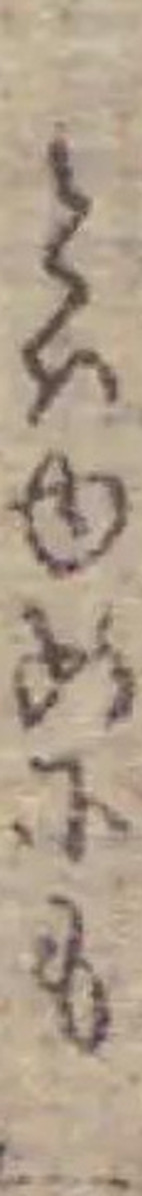とはゆめにも
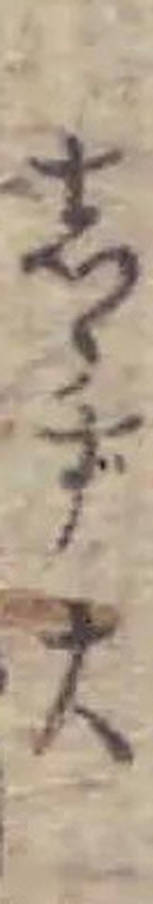しらず大
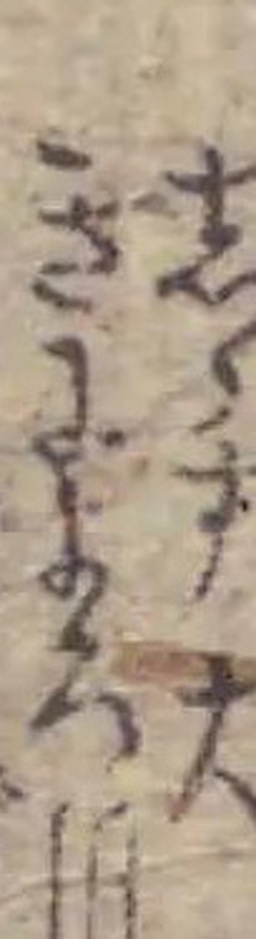きによろ
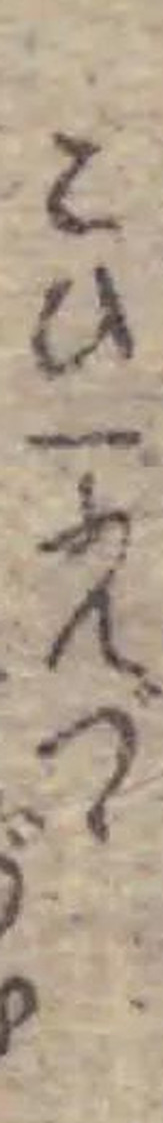こひ一ふんづゝ
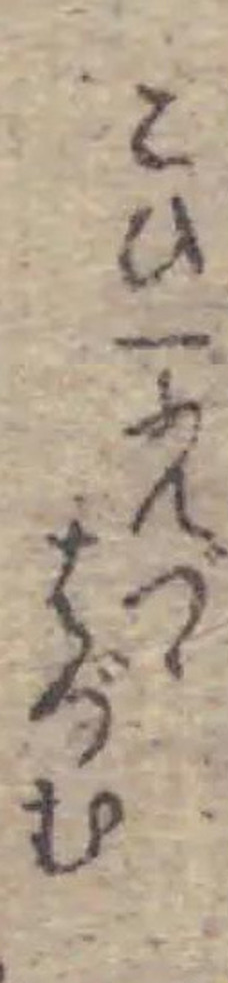こひ一ふんづゝ
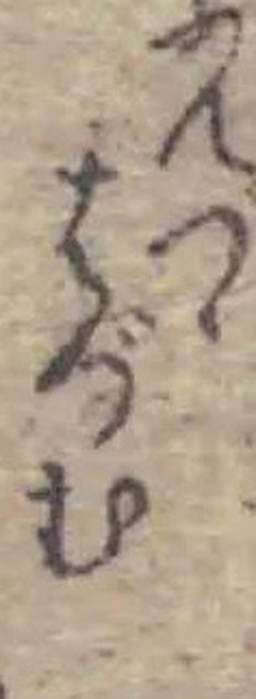はづむ
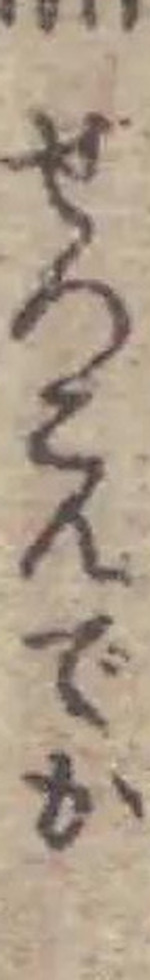せつこんでか
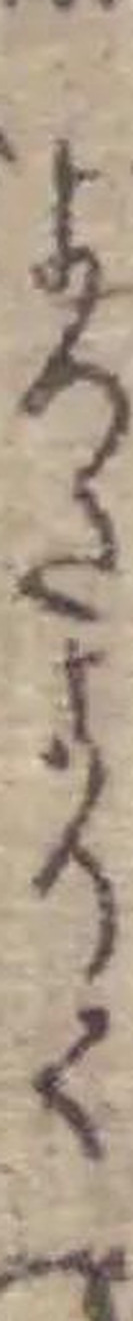よつたよりく
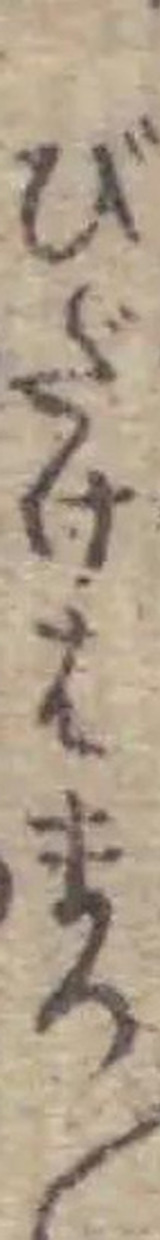びだけはまつ
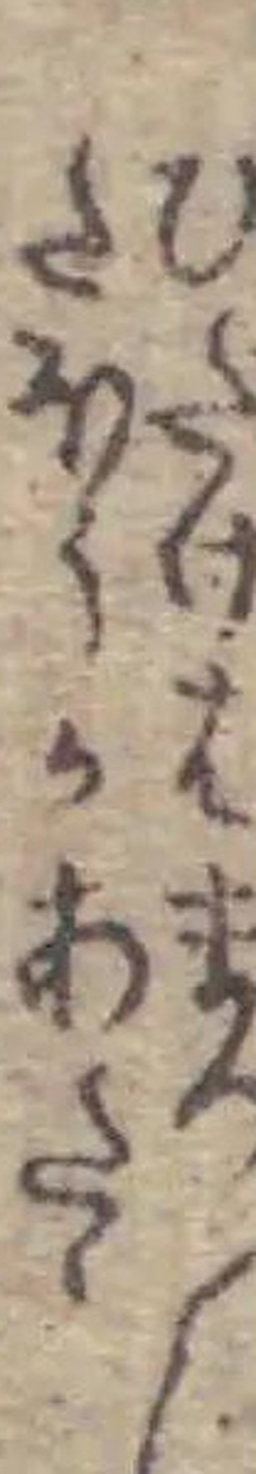たほうかあたゝ
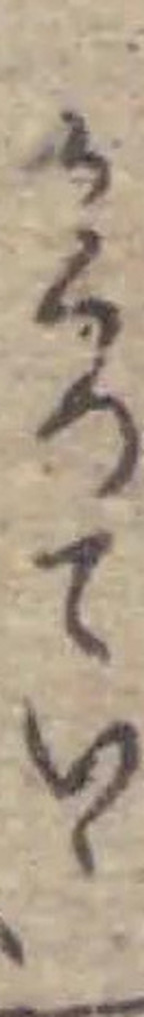かくつていゝ

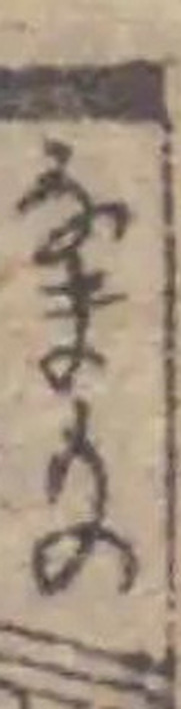なまりの
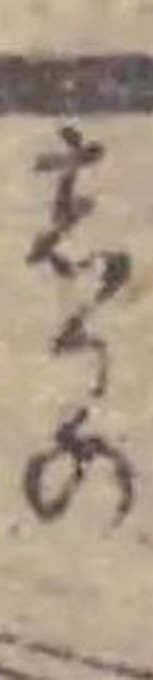しりの
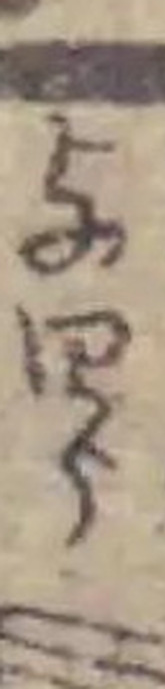与四郎
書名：色男其処此処 3巻
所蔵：国立国会図書館 National Diet Library, JAPAN
